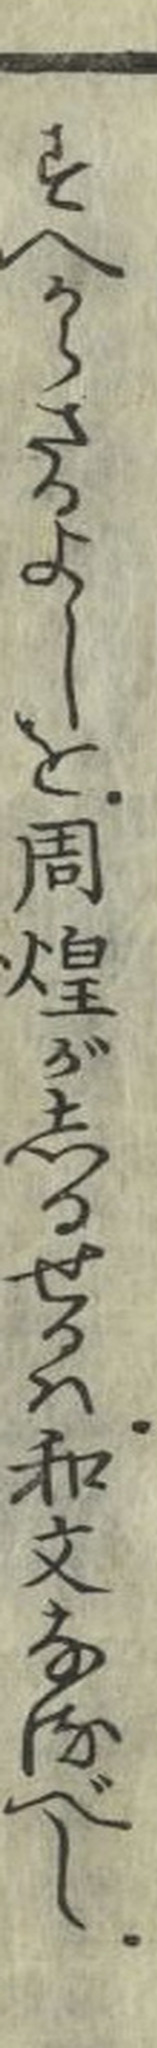すへからさるよしを・周煌がしるせるは・和文なるべし・
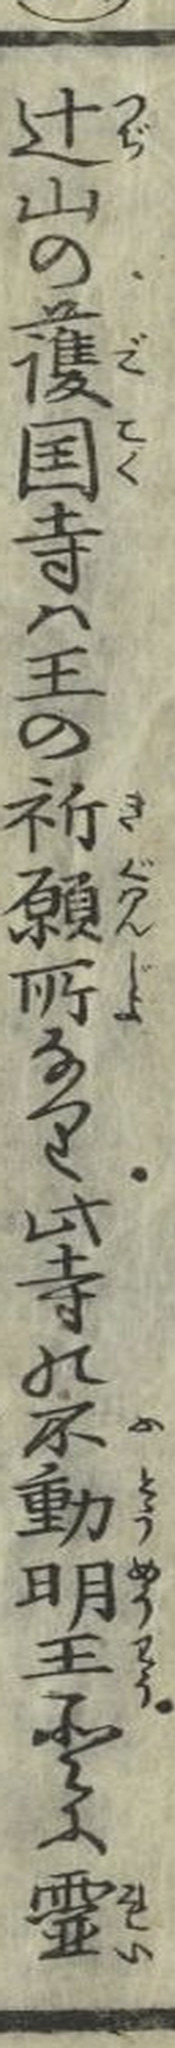辻山の護国寺は王の祈願所なり・此寺の不動明王・ことに霊
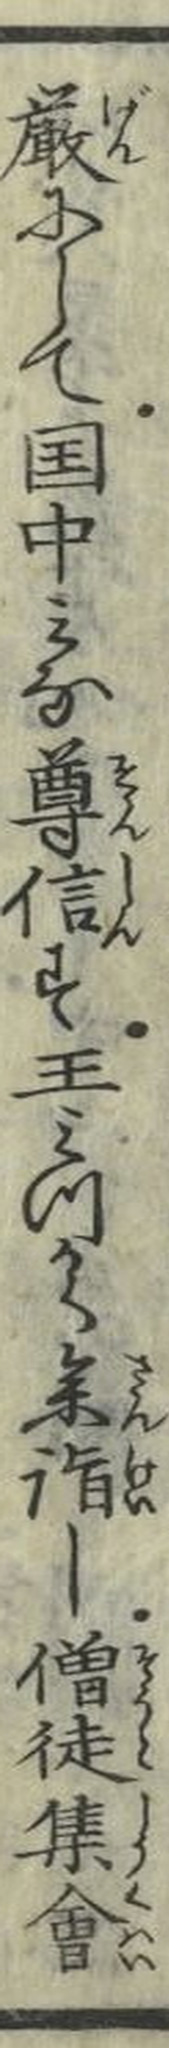厳にして・国中みな尊信す・王みつから参詣し・僧徒集会
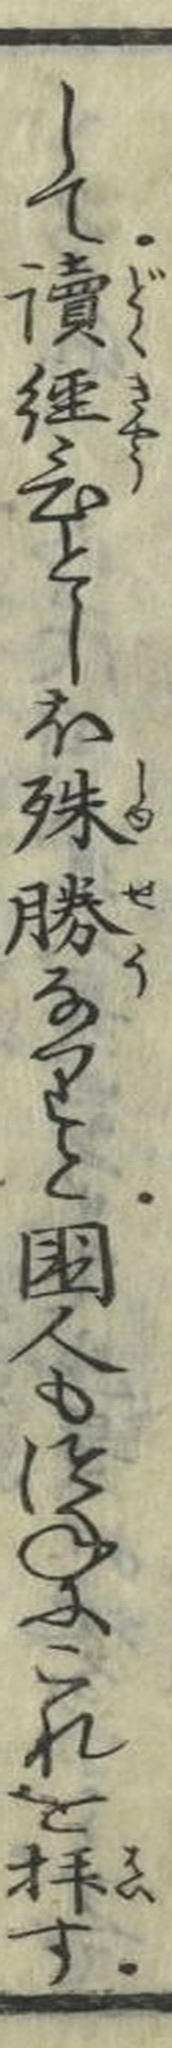して・讀經ひとしほ殊勝なりと・國人もつねにこれを拝す・
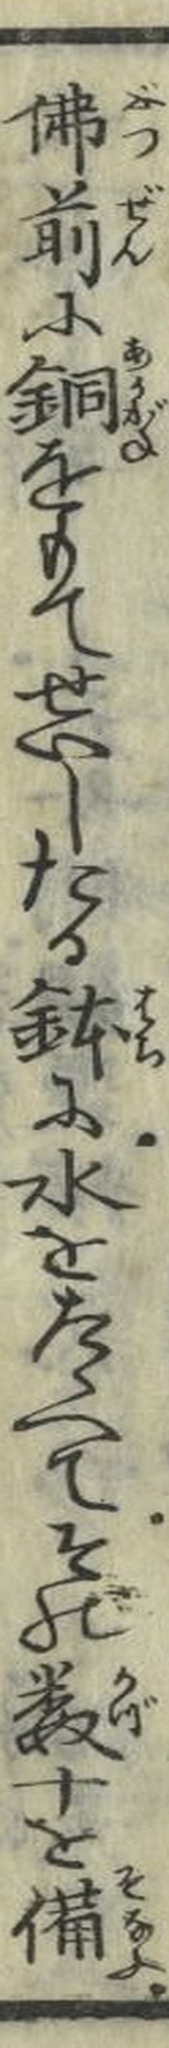佛前に銅をもてせいしたる鉢に・水をたゝへて・その数十を備・
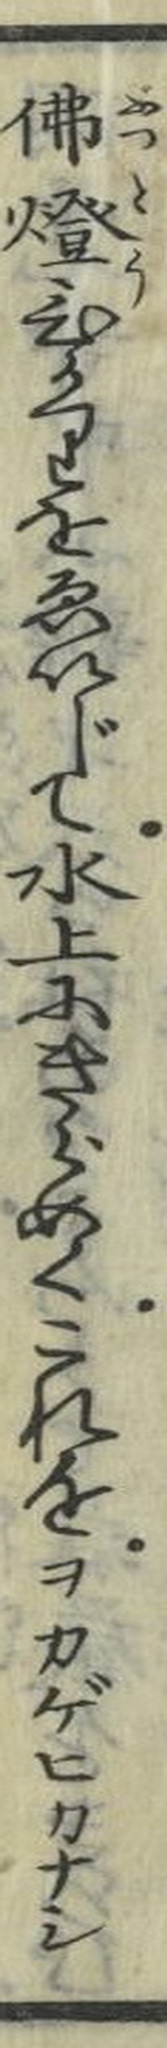佛燈ひかりをゑいじて・水上にきらめく・これを・ヲカゲヒカナシ
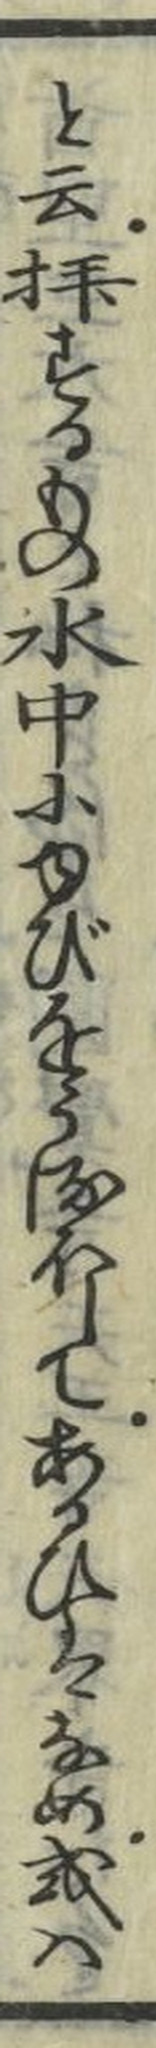と云・拝するもの水中にゆびをうるほして・あるひはなめ・或は
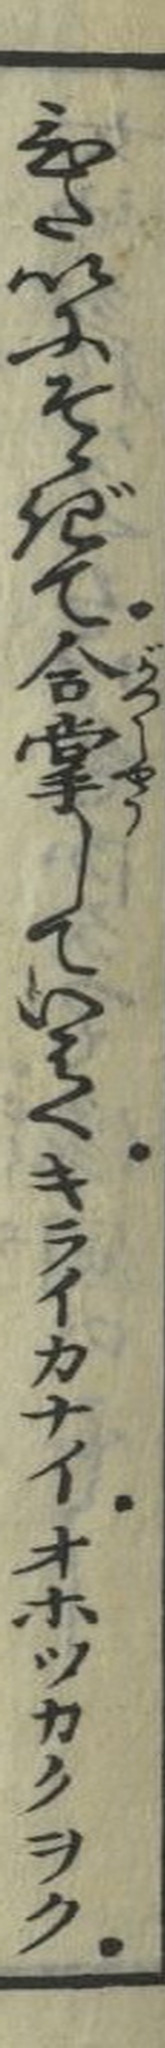ひたいにそゝぎて・合掌していはく・キライカナイ・オホツカクヲク・
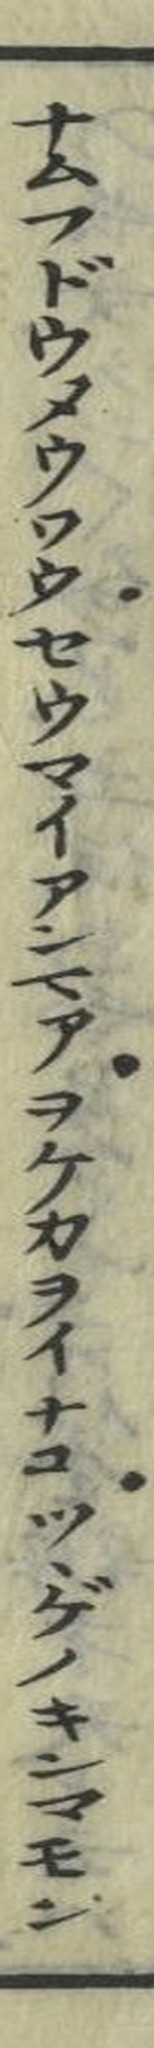ナムフドウメウワウ・セウマイアンマア・ヲケカヲイナコ・ツヽゲノキンマモン
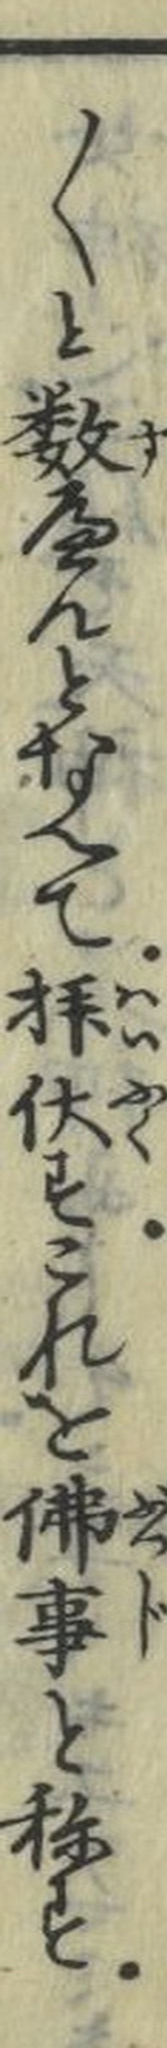〳〵と数へんとなへて・拝伏す・これを佛事と称す・
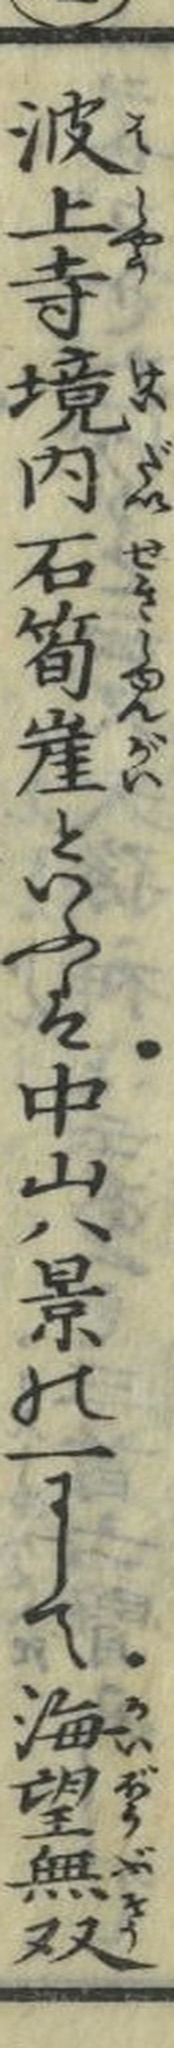波上寺境内石筍崖といふは・中山八景に一にして・海望無双
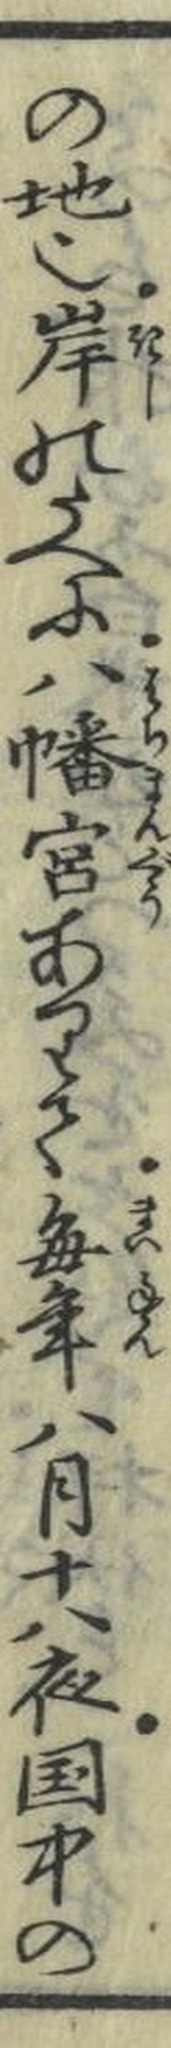の地也・岸のうへに・八幡宮ありて・毎年八月十八夜・国中の
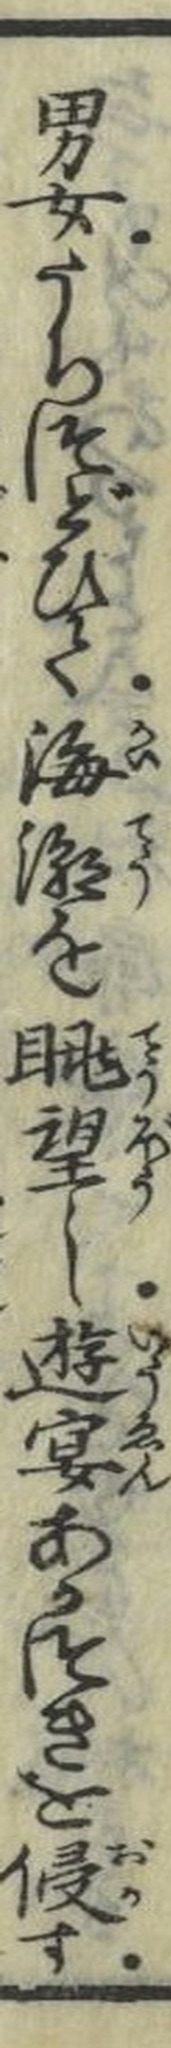男女・うちつどひて・海潮を眺望し・遊宴あかつきを侵す・
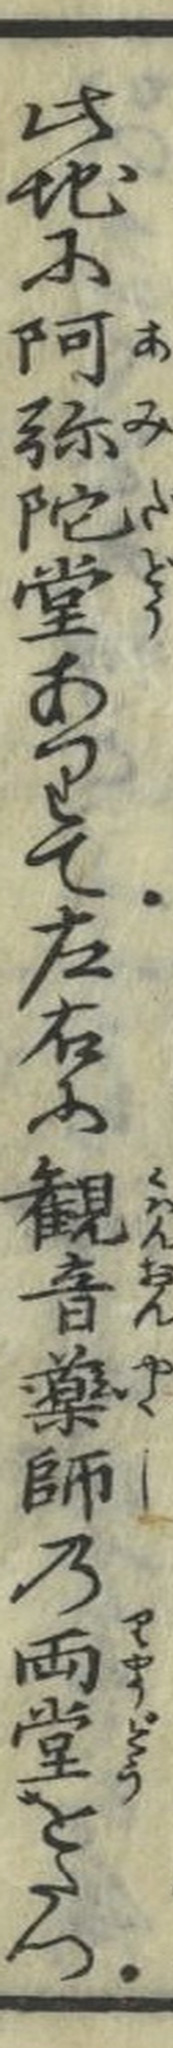此地に阿弥陀堂ありて・左右に観音薬師の両堂をたつ・
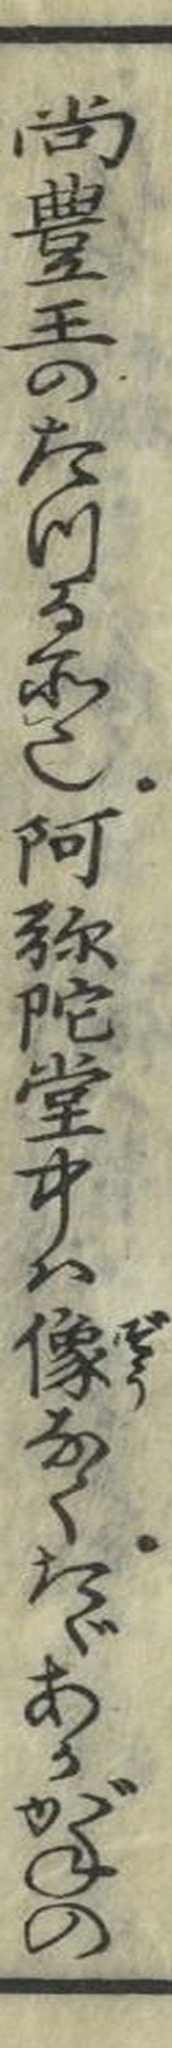尚豊王のたつる所也・阿弥陀堂中は像なく・たゞあかがねの
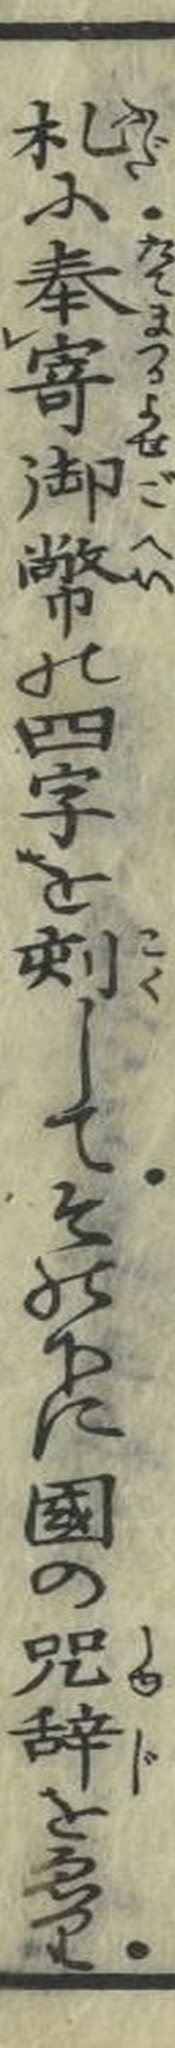札に・奉寄御幣の四字を刻して・その下に國の咒辞をゑり・
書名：琉球秊代記 附雑話 全
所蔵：University of the Ryukyus Library
